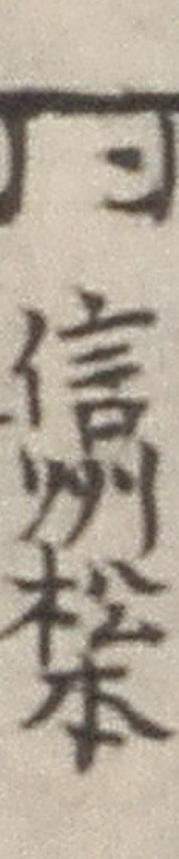同信州松本
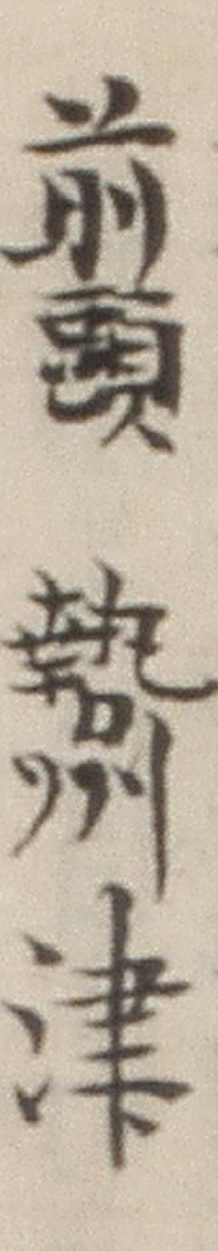前頭参州津
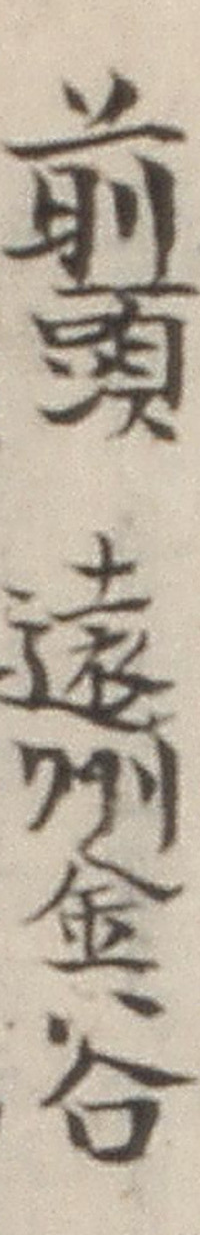前頭遠州金谷
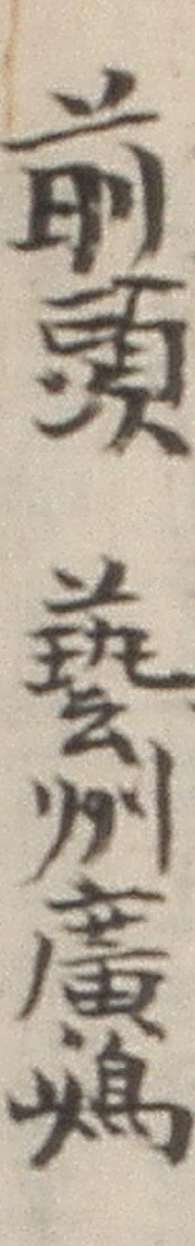前頭藝州廣嶋
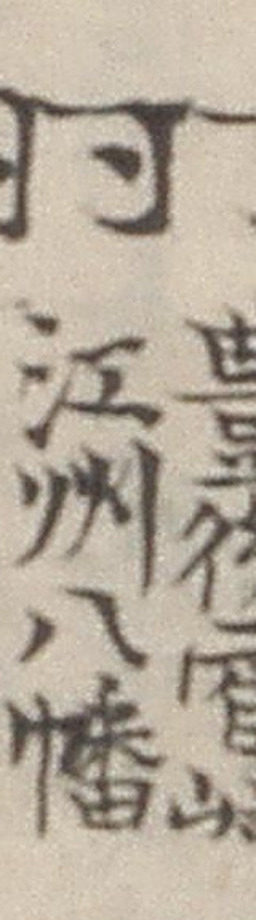同江州八幡
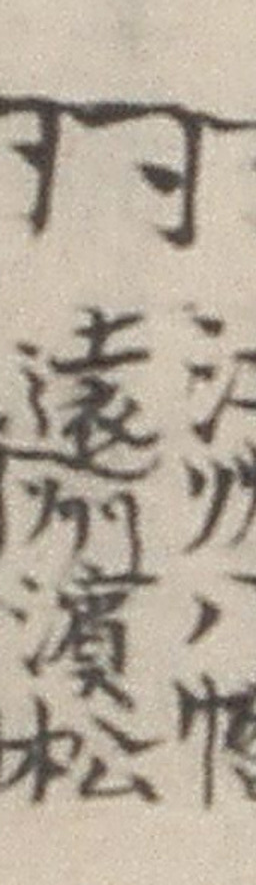同遠州濱松
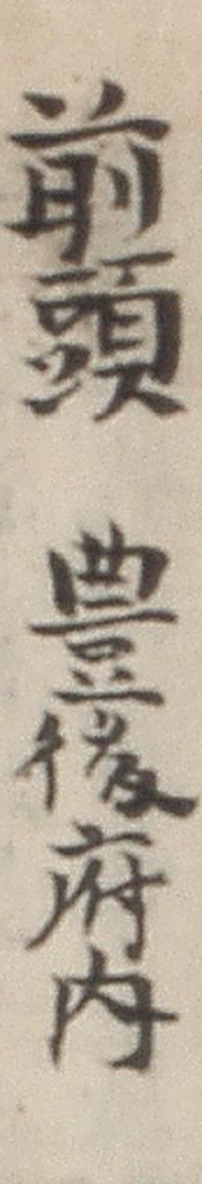前頭豊後府内
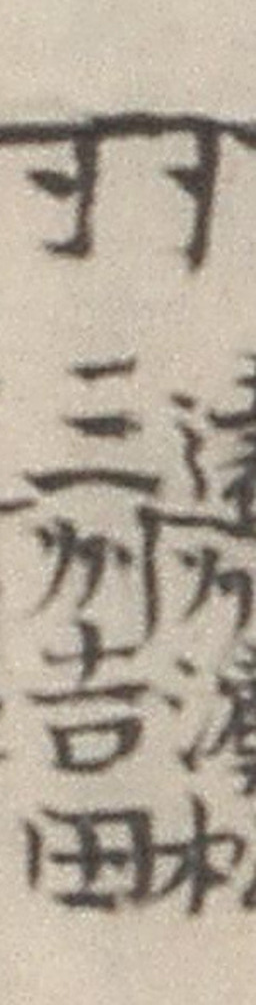同三州吉田
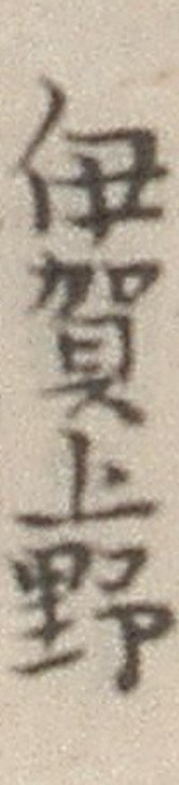伊賀上野
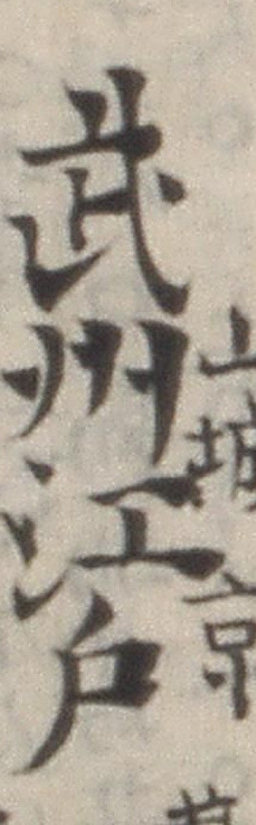武州江戸
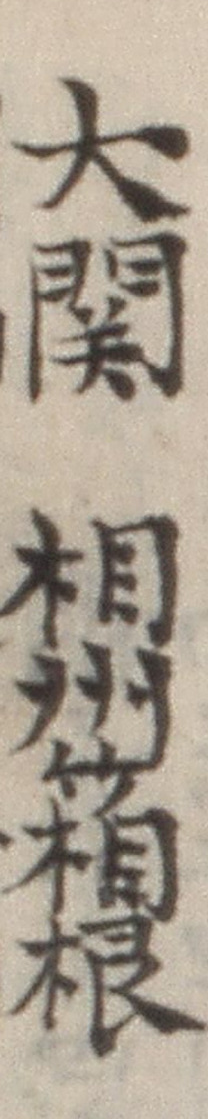大関相州箱根
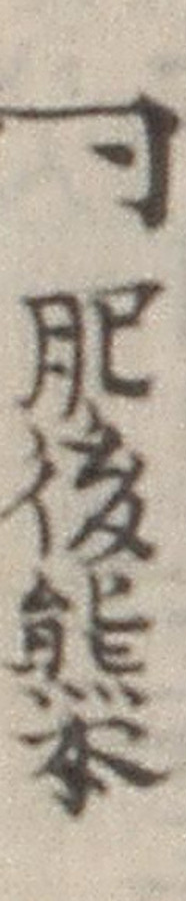同肥後熊本
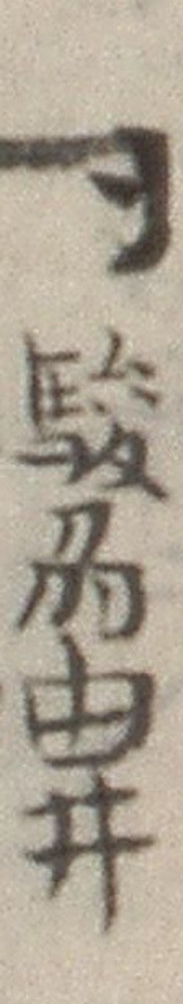同駿州由井
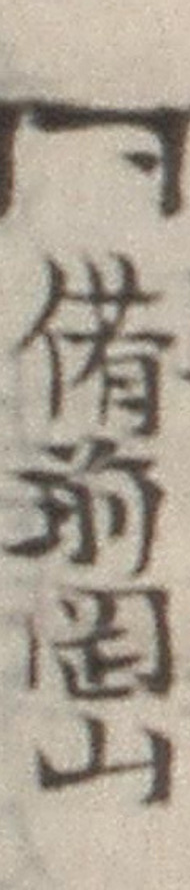同備前岡山
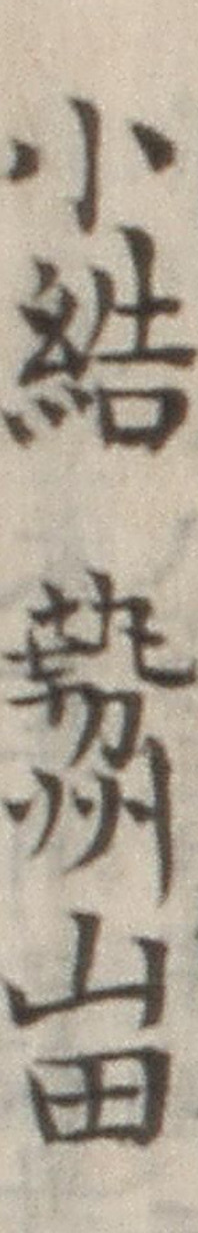小結勢州山田
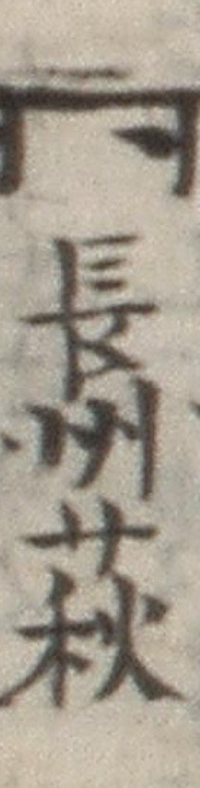同長州萩
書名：諸國大地震年代記末代噺種
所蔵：東京大学地震研究所図書室 Earthquake Research Institute Library, The University of Tokyo, JAPAN
